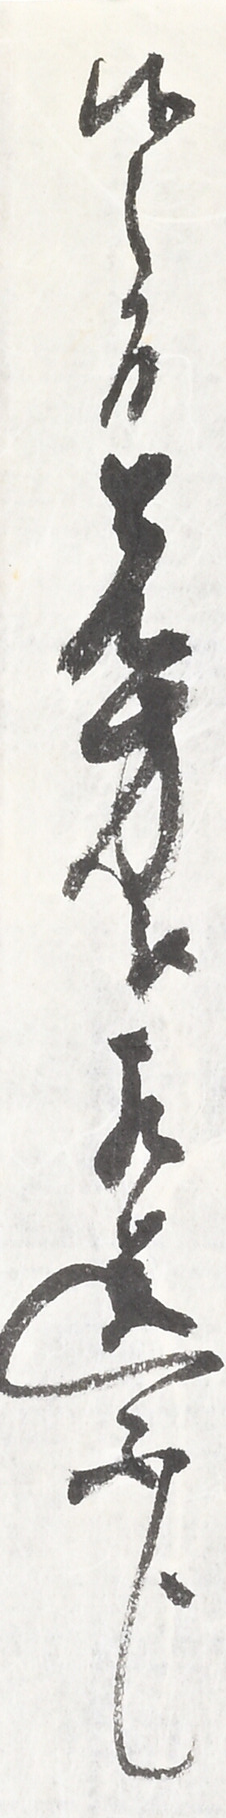候之間先方え相送不申候
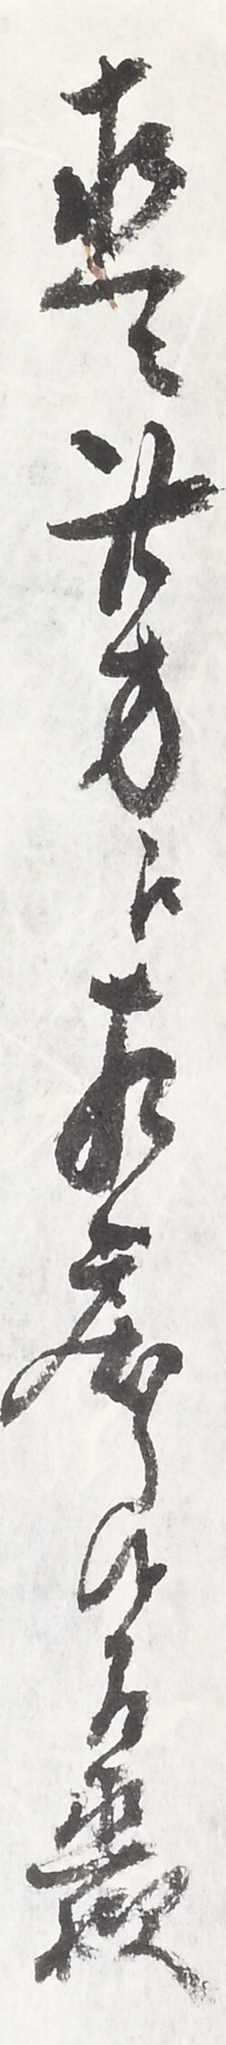直に此方え相戻り候間直様
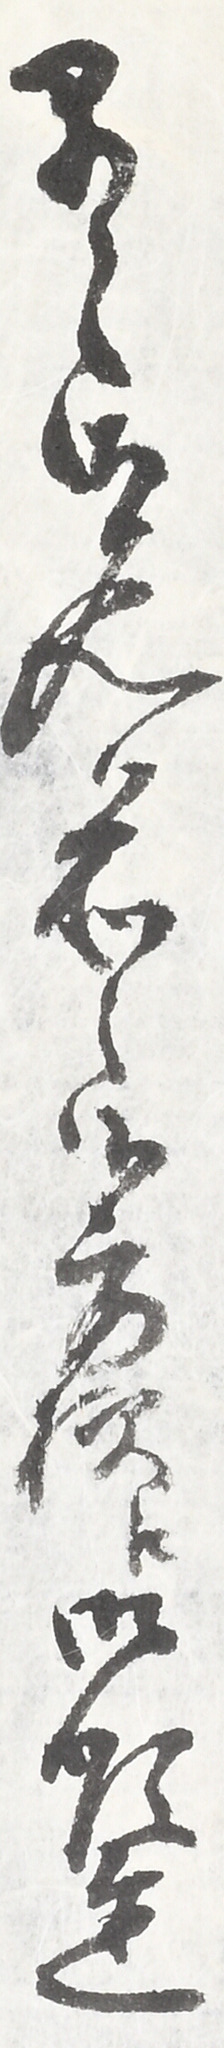早々御名前之御方様え御順達
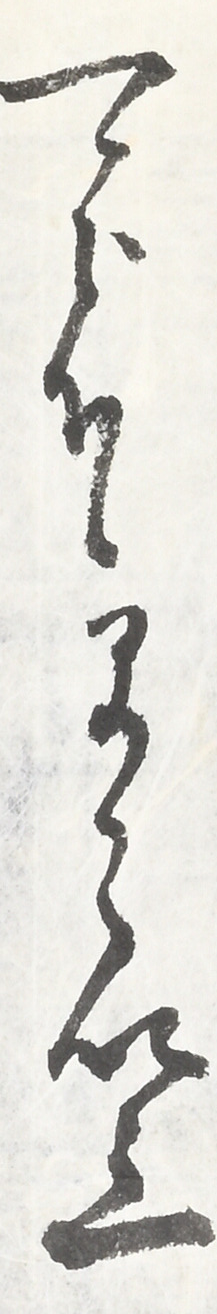可被下候早々以上
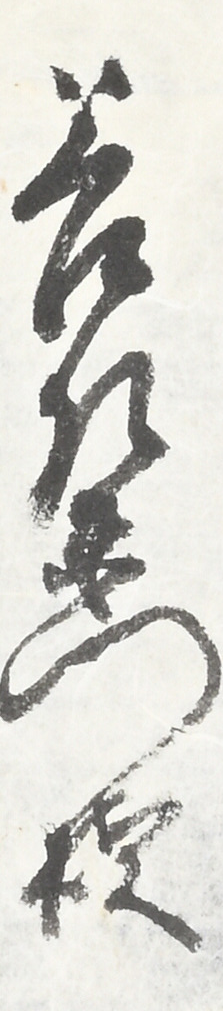善左衛門様
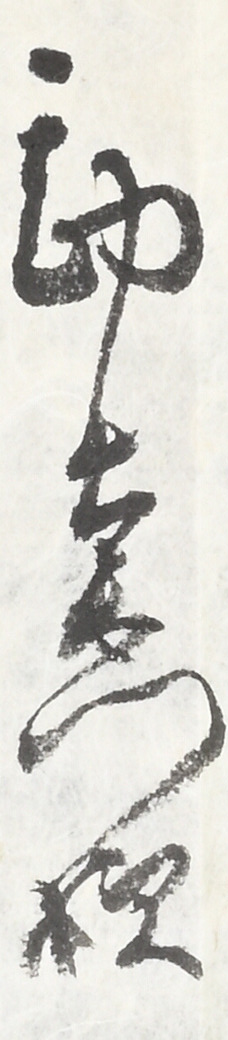勘右衛門様
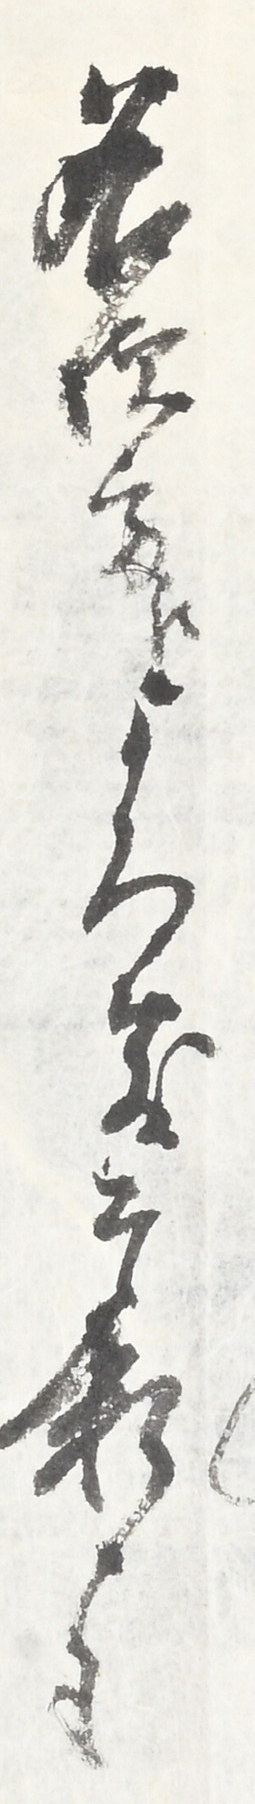各様方えよろ敷奉頼候以上
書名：廻章
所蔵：伊那市立高遠町図書館・合同会社AMANE
